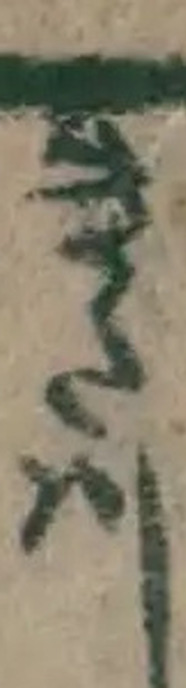きたは
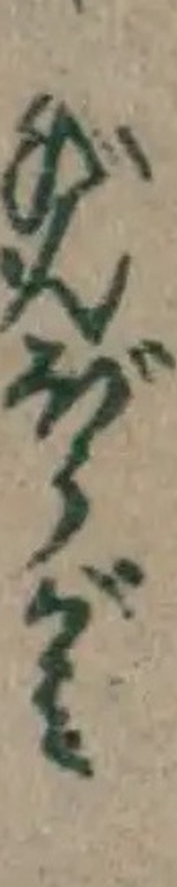びんぼうがみ
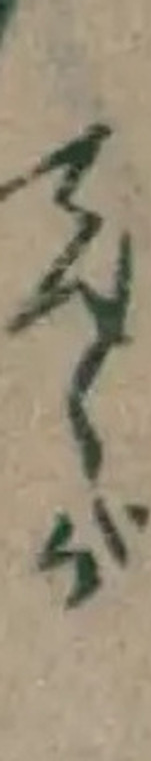てん〳〵が
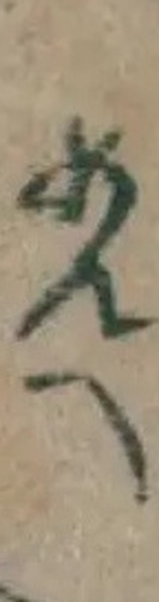あんへ
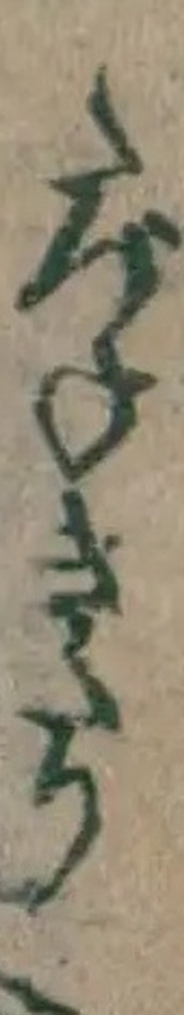たづねきたり
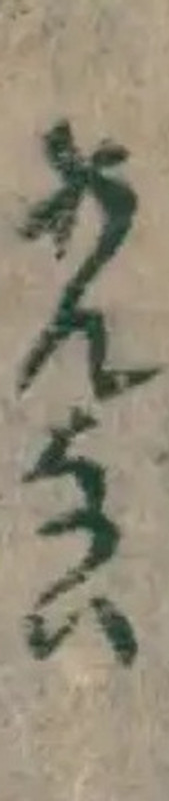あんない

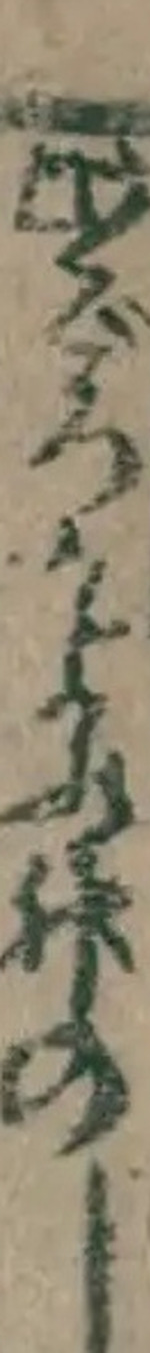此ごろかよふ神の
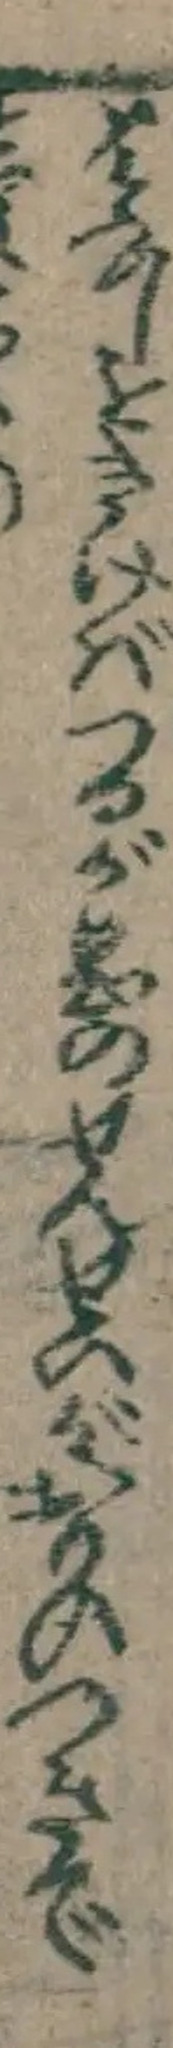はなしをきけばつるが岡のせんせいがおもいつきで
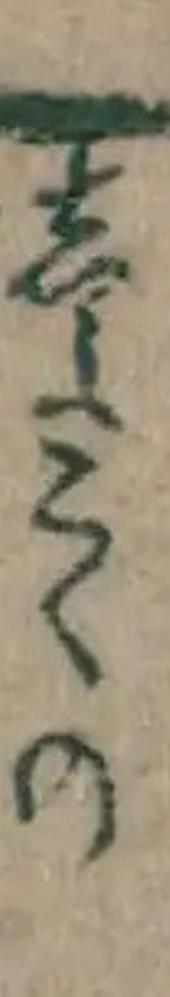しよこくの
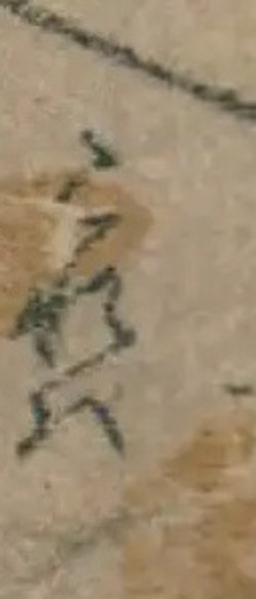これは
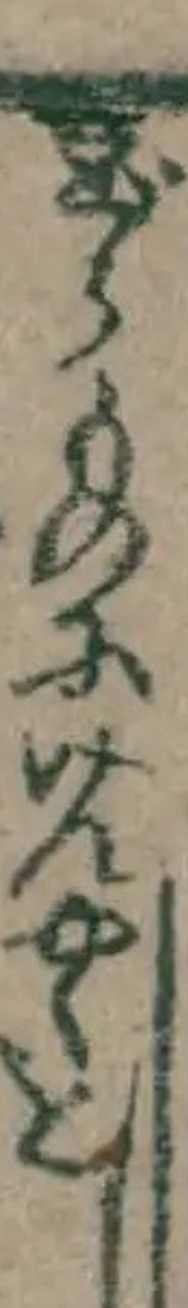どらものにけんやくを
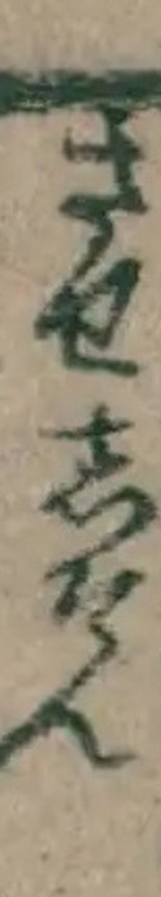させしそん
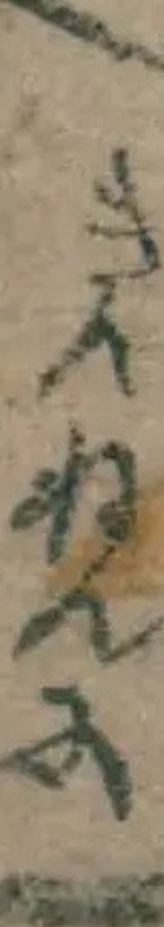きんねんに
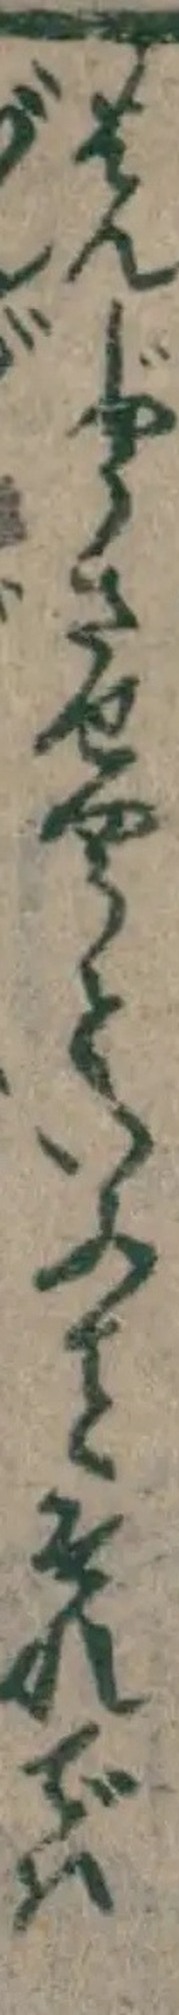はんじやうさせやうといふことそれでは
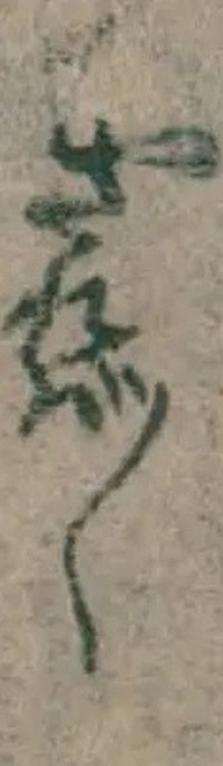されば〳〵
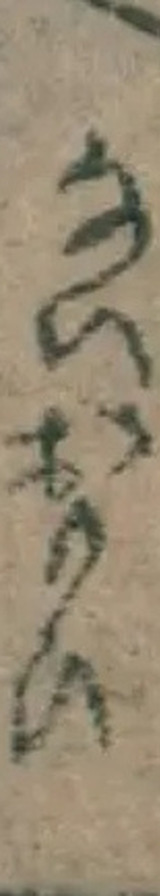ないおもひ
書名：頓作時雨月 3巻
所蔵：国立国会図書館 National Diet Library, JAPAN
